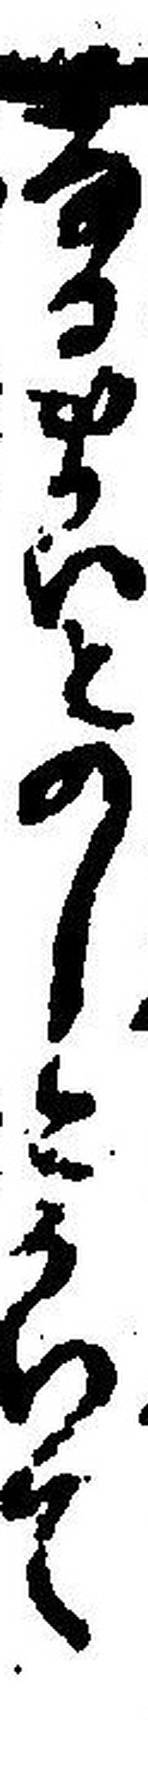なるまいとのしとかいて
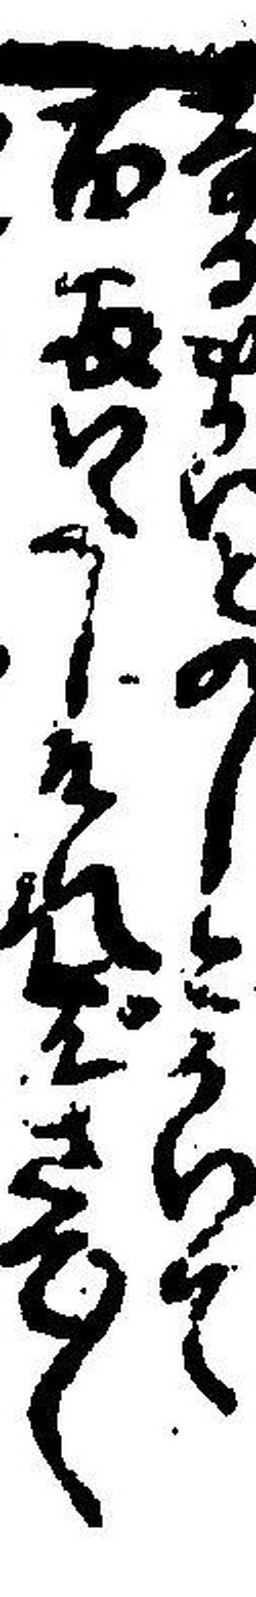百両いたしければさて〳〵
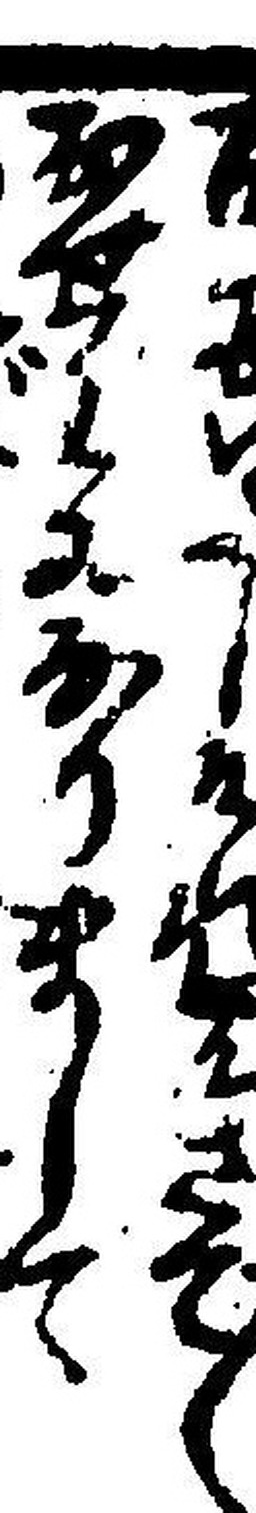おせわになりまして
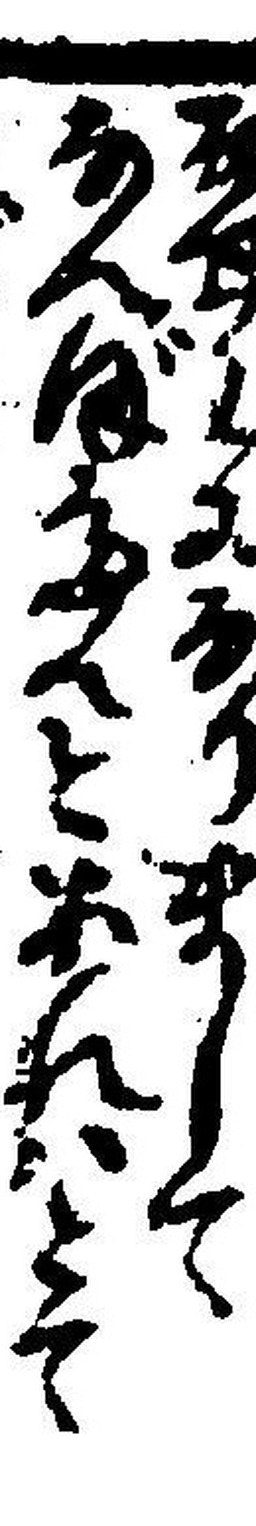なんぼたんとおれいはとて
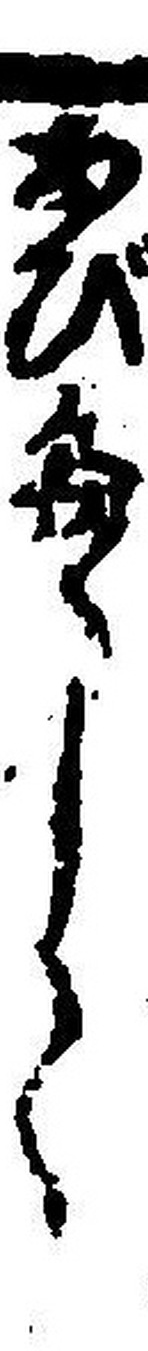おびたゝしく
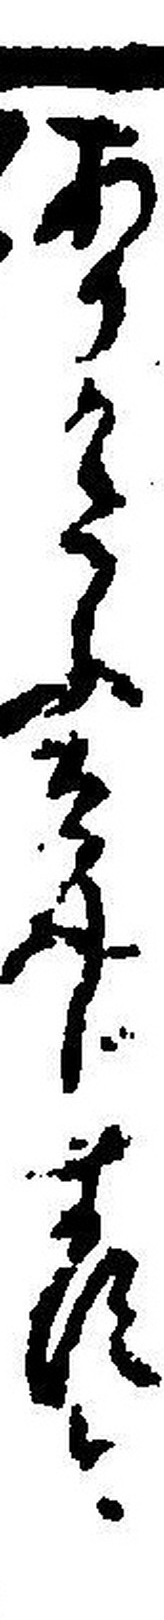ありかとふそんじますと
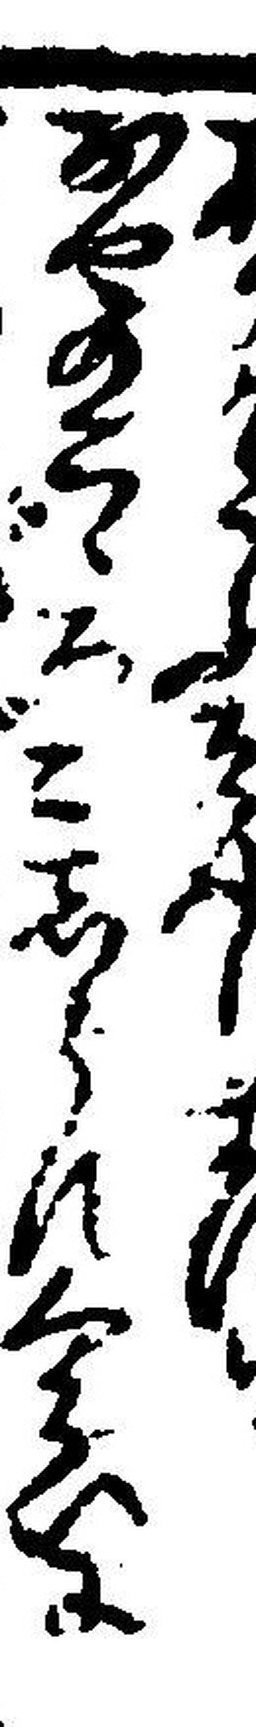おやのこゝろこしらすくらいに
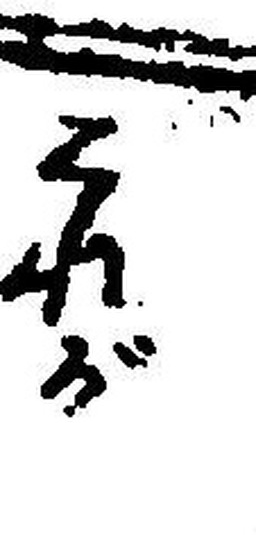これが
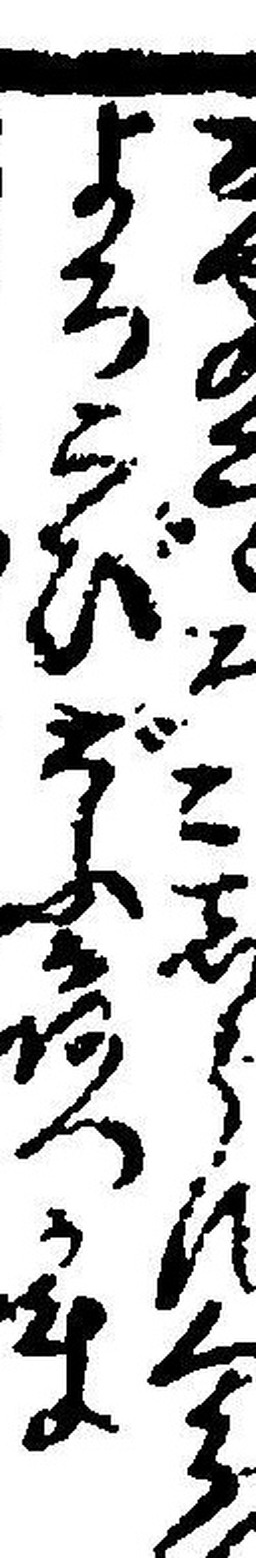よろこびどふかあつかま
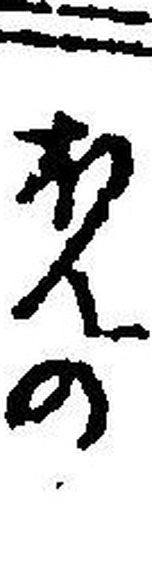ほんの
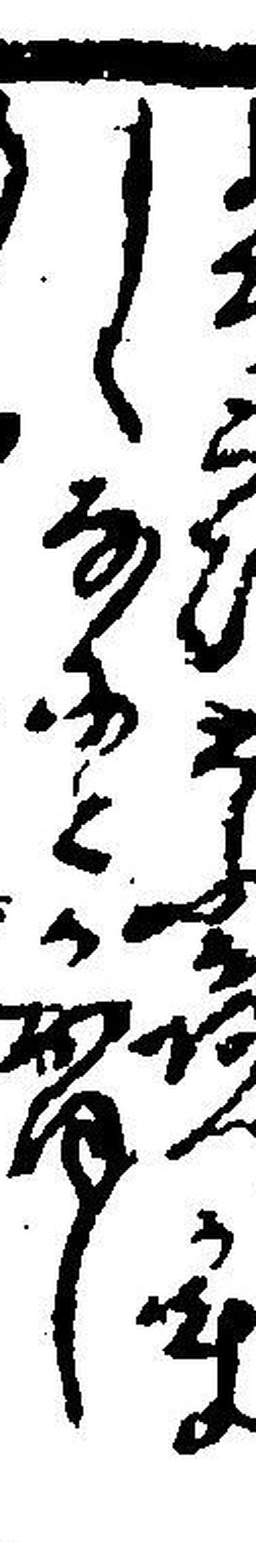しくなにとかおほし
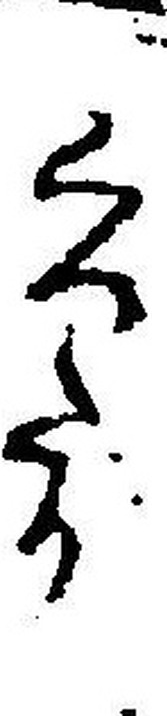くつたり
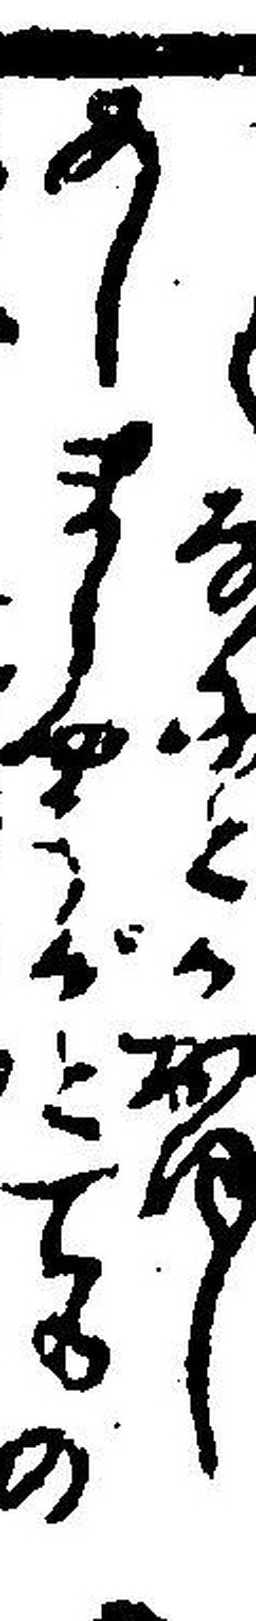めしましやうがとてもの
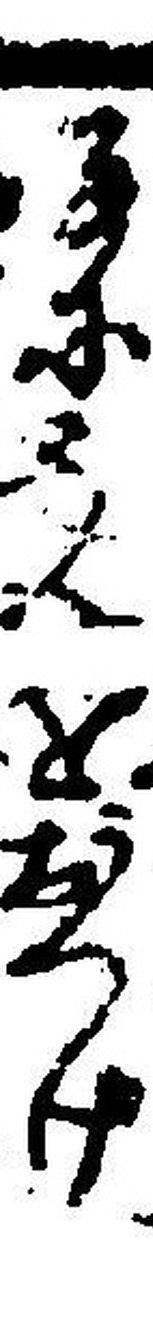事にうんをおつけ
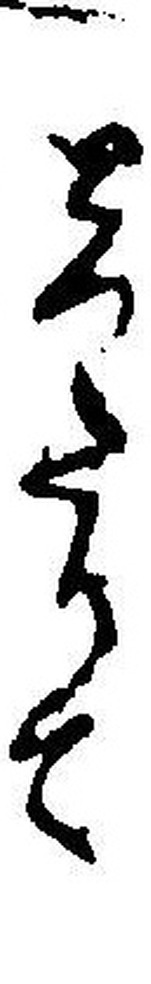とつたりて
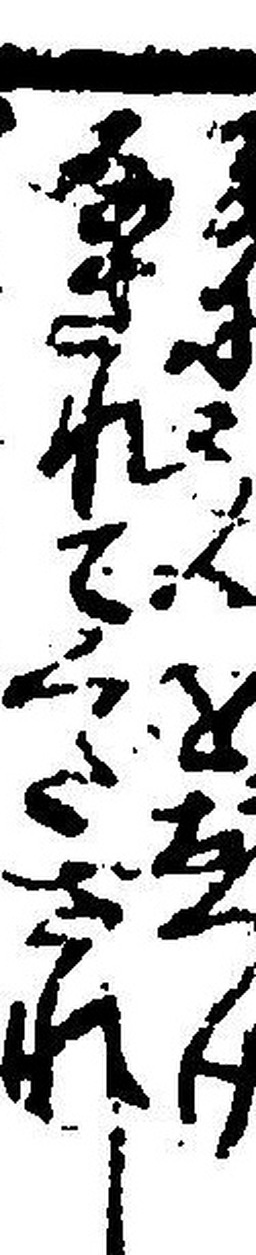なされてくだされ
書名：牡丹餅棚有 / 市場通笑作
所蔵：東京大学総合図書館 General Library in the University of Tokyo, JAPAN
